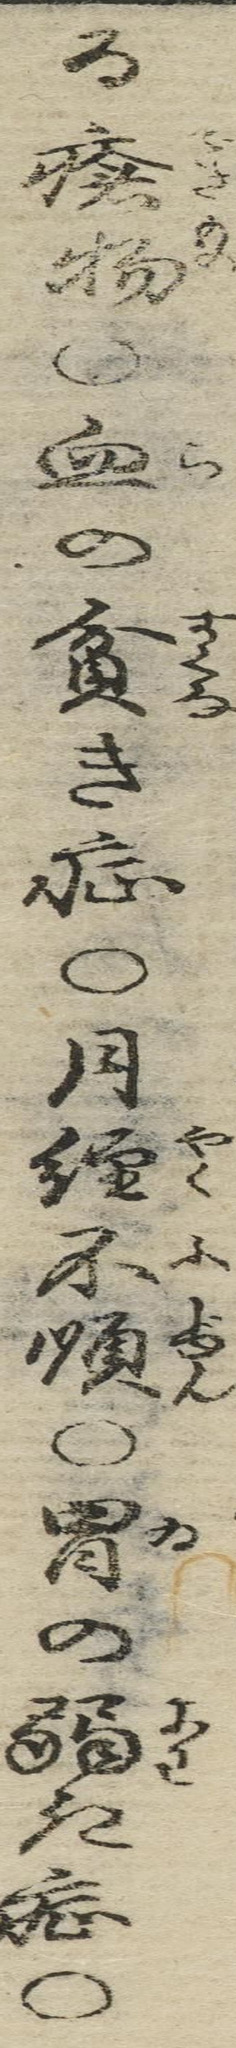る瘡物○血の貧き症○月経不順○胃の弱き症○
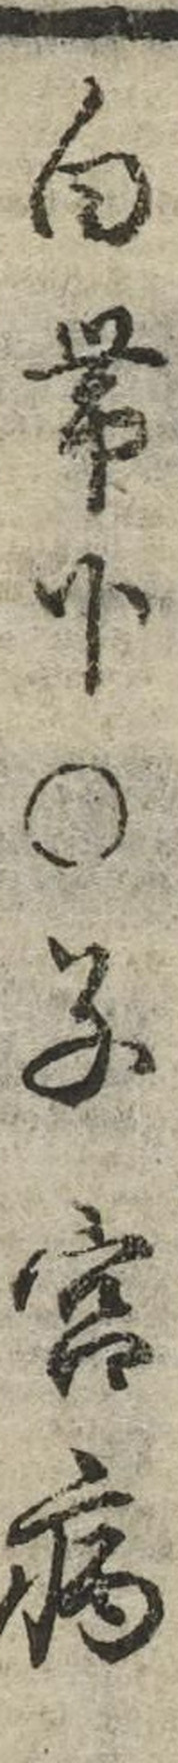白帯下○子宮病
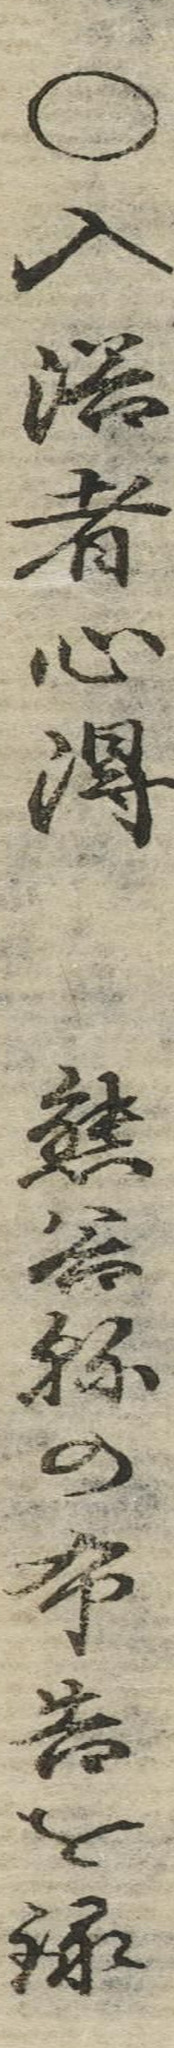○入浴者心得熊谷県の布告を録
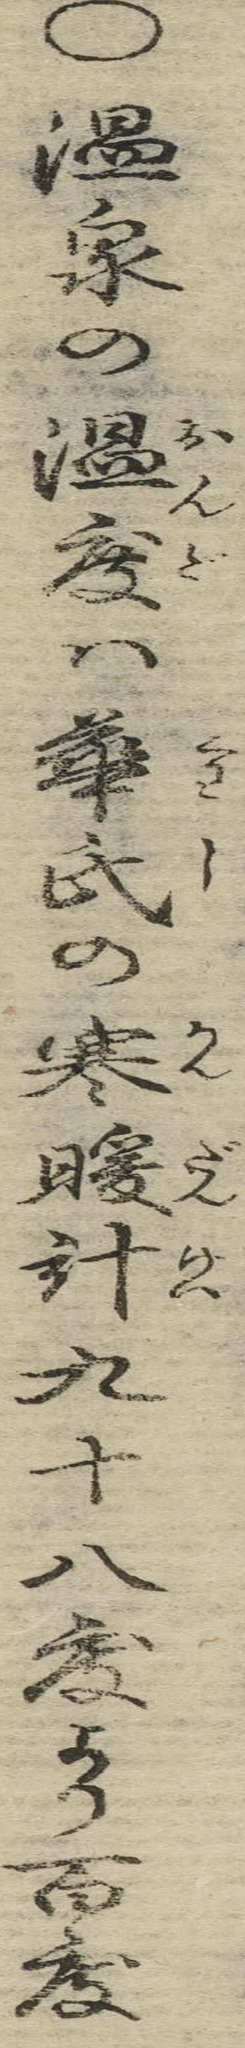○温泉の温度は華氏の寒暖計九十八度より百度
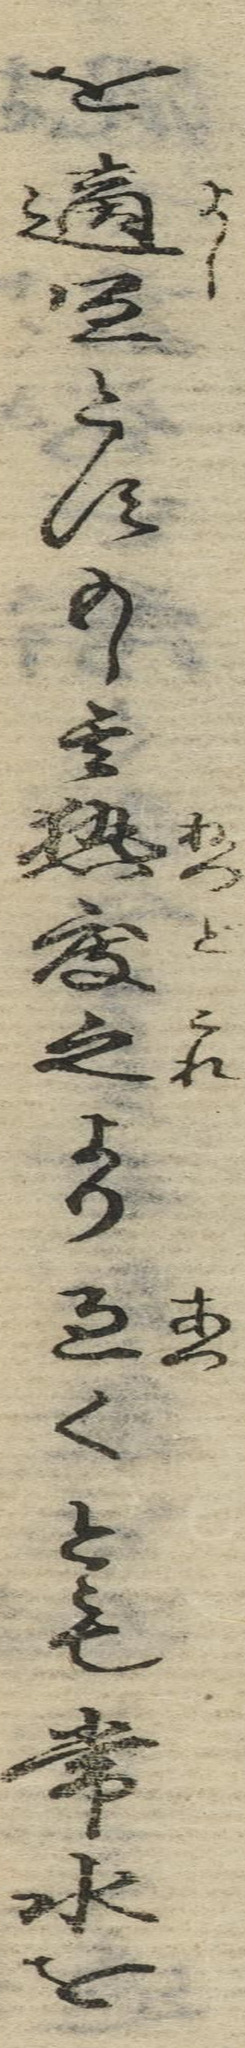を適宜とすもし其熱度之より過くとも常水を

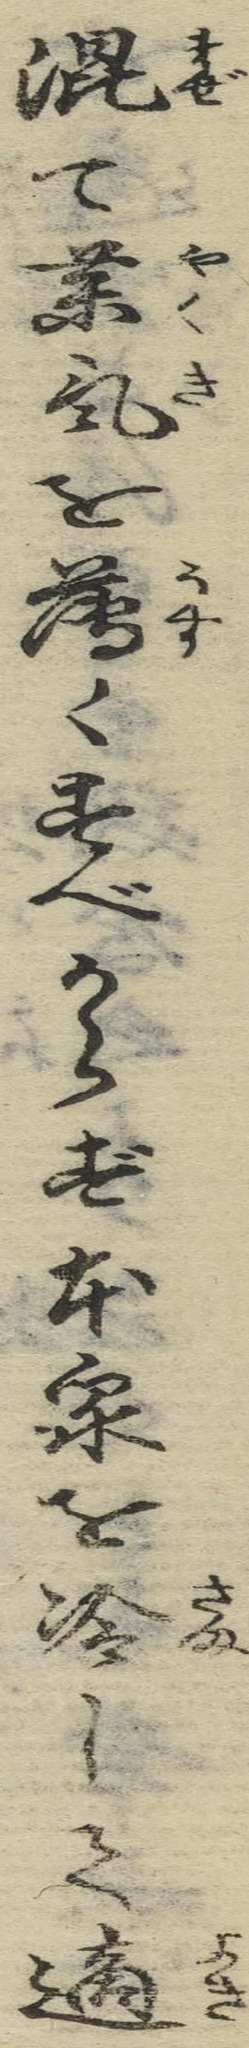混て薬気を薄くすべからず本泉を冷して適
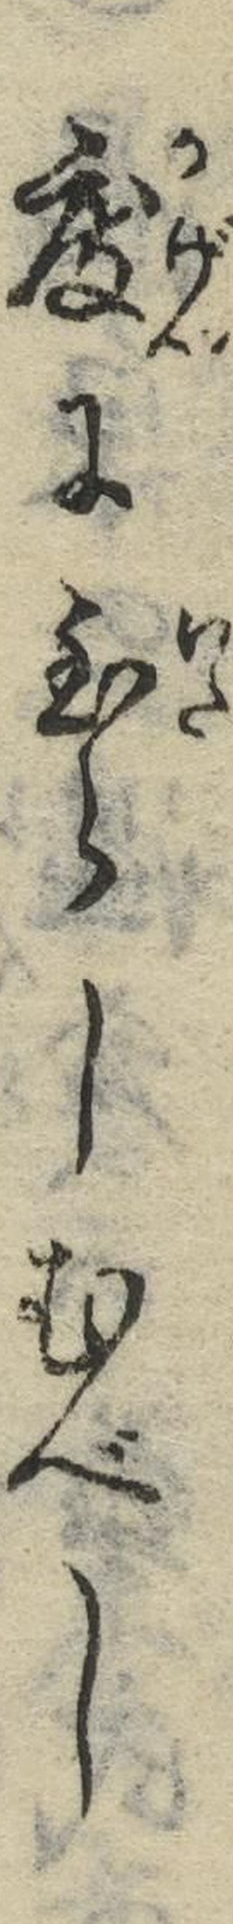度に至らしむべし
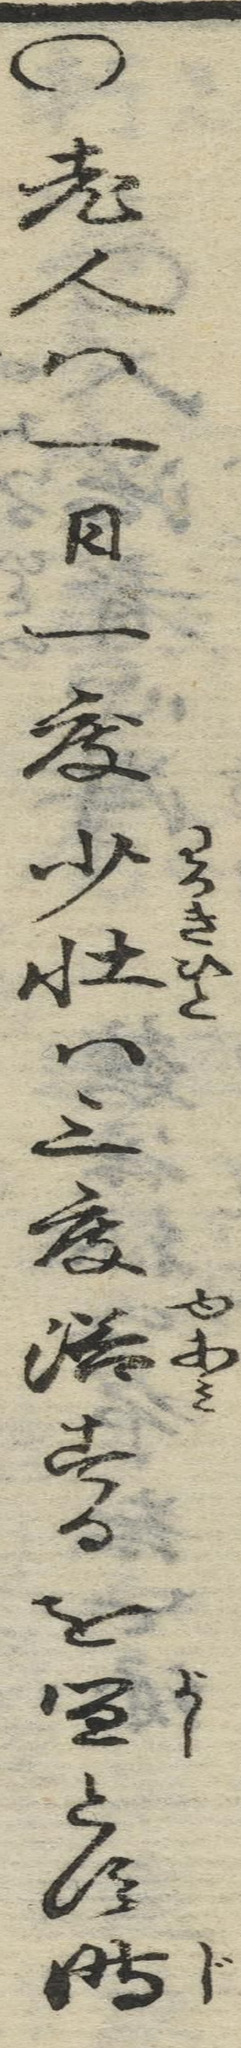○老人は一日一度少壮は三度浴するを宜とす時
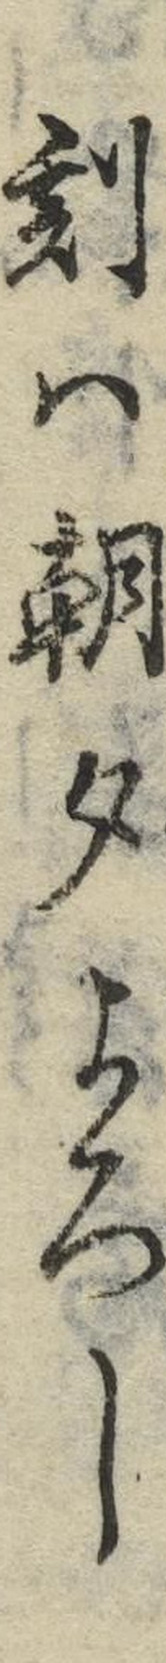刻は朝夕よろし
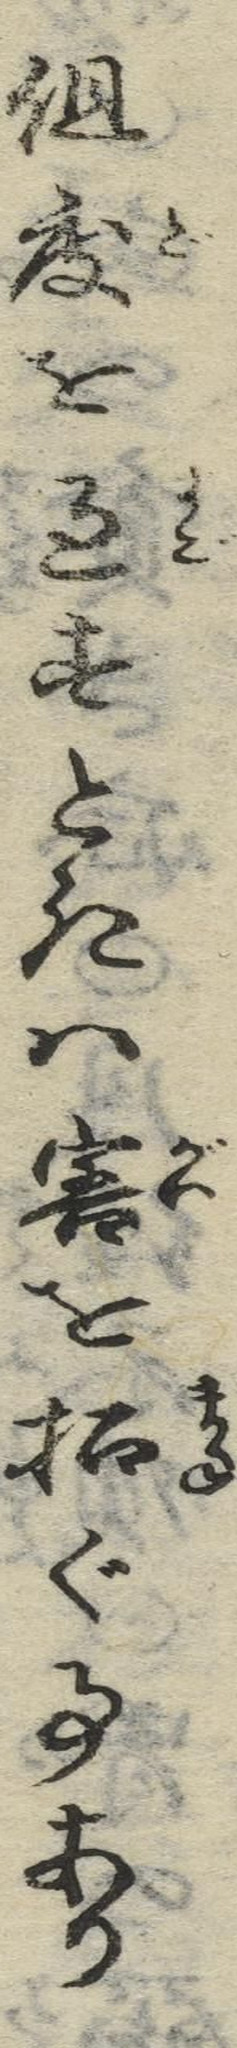但度を過すときは害を招ぐ事あり
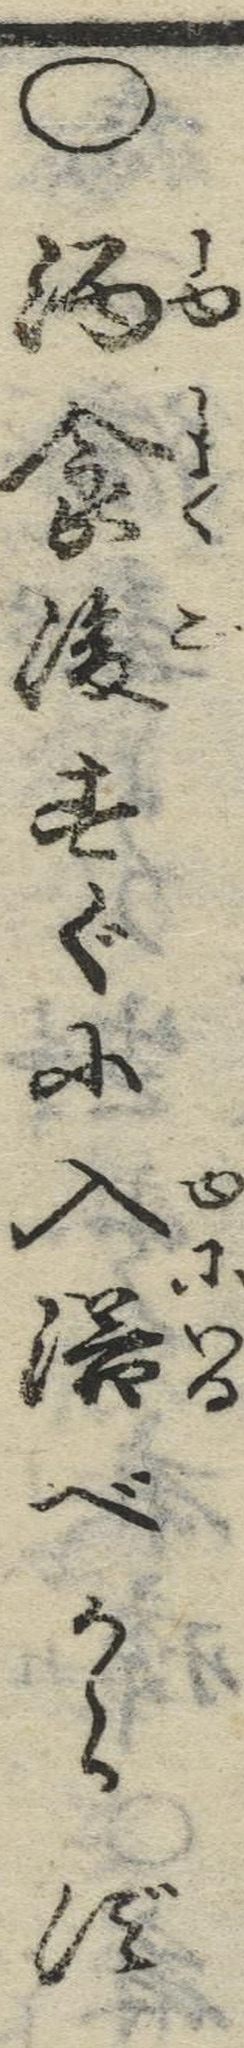○酒食後すぐに入浴べからず
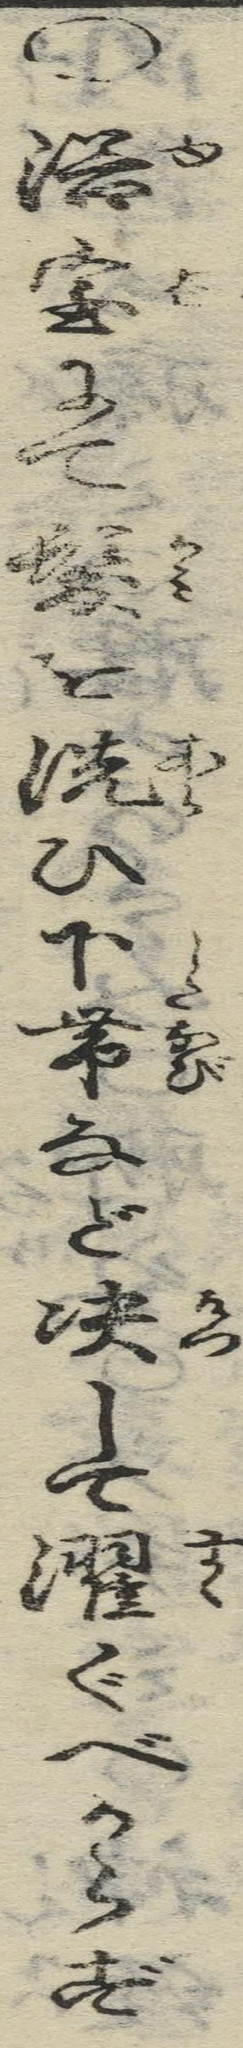○浴室にて髪を洗ひ下帯など決して濯ぐべからず
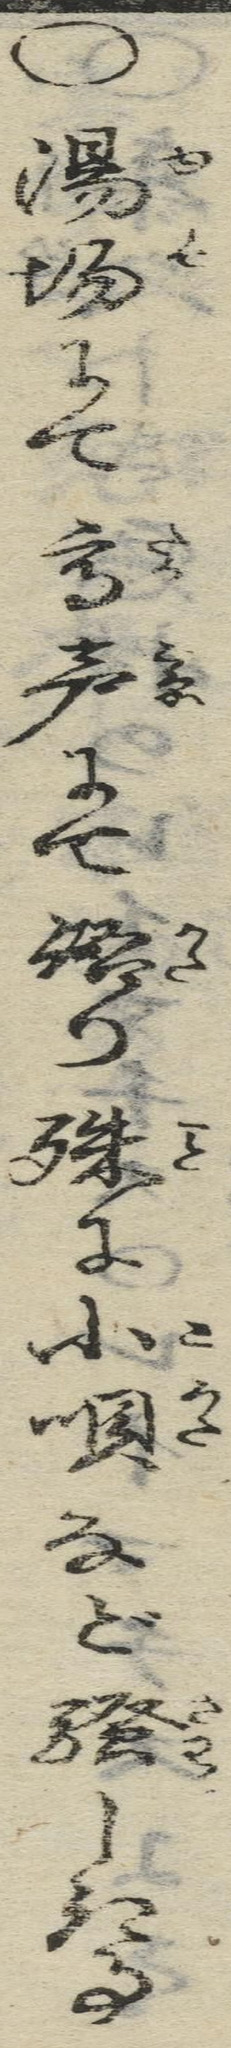○湯場にて高声にて語り殊に小唄など騒しき事
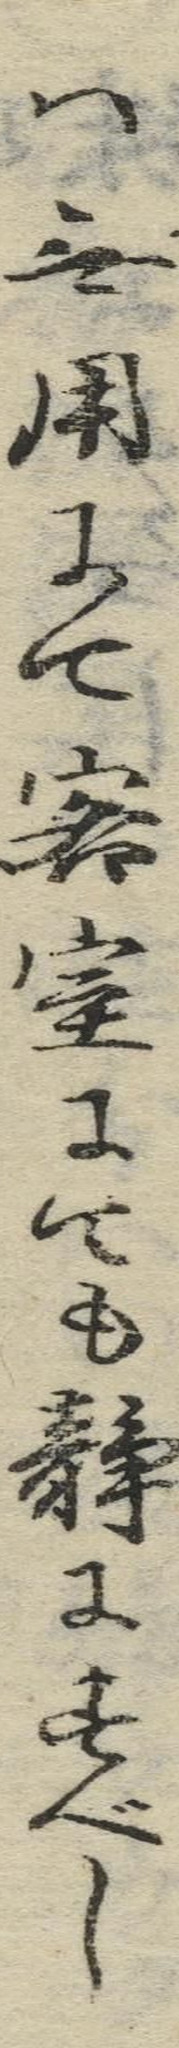は無用にて客室にても静にすべし
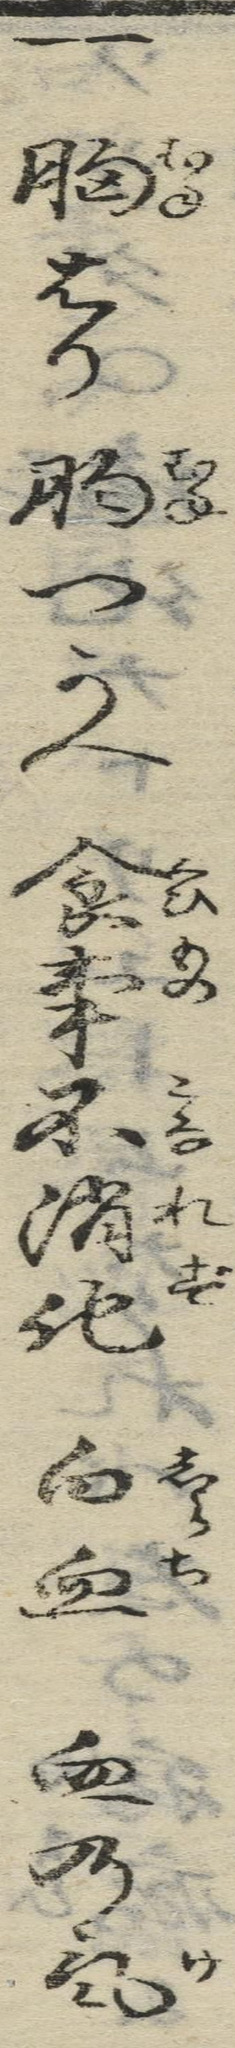一胸はり胸つかへ食事不消化白血血の気
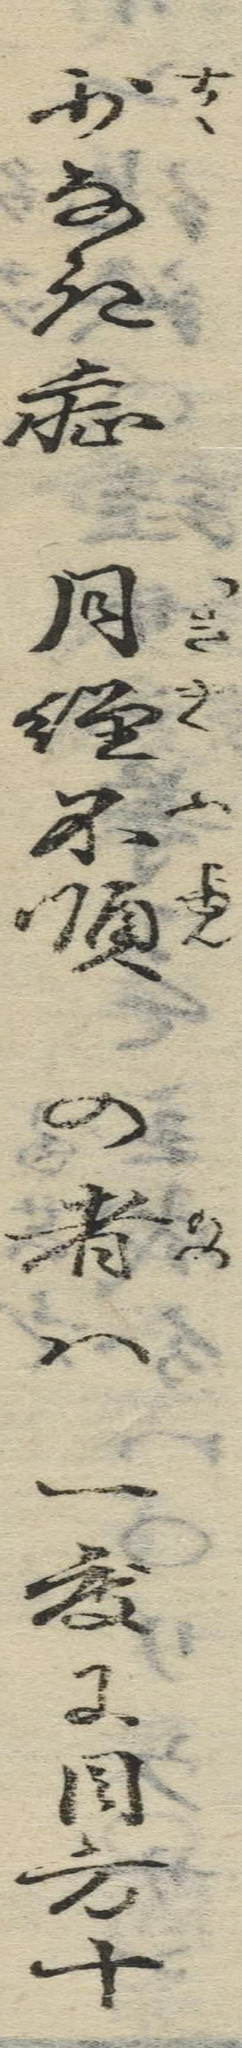少なき症月経不順の者は一度に目方十
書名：上州伊香保鑛泉圖會　全
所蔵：東京大学地震研究所図書室 Earthquake Research Institute Library, The University of Tokyo, JAPAN
